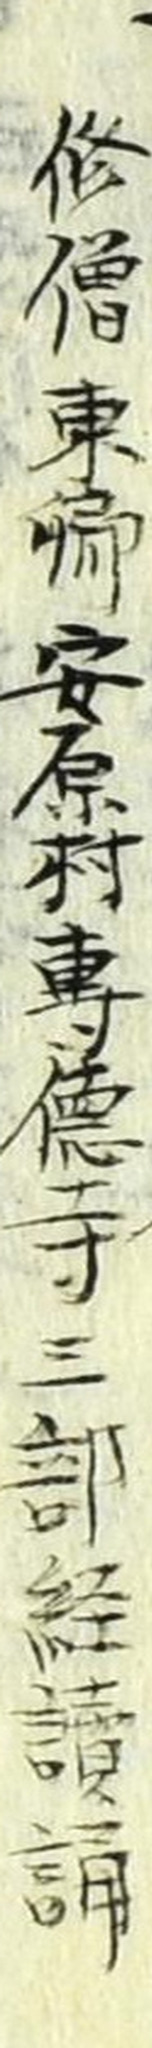修僧東郷安原村専徳寺三部経読誦
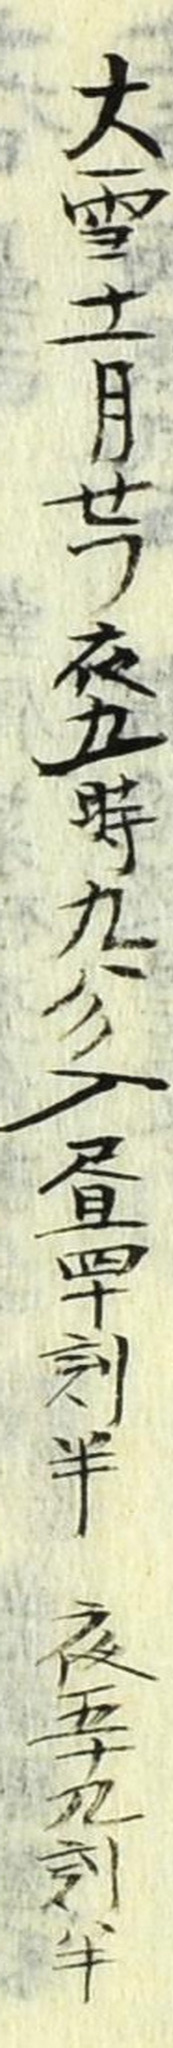大雪十一月せつ夜五時九分入昼四十刻半夜五十九刻半
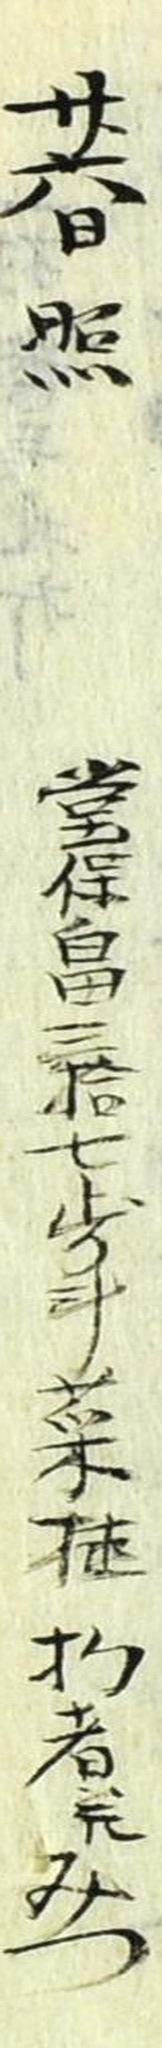廿六日照堂保畠三拾七歩計菜植者幷みつ
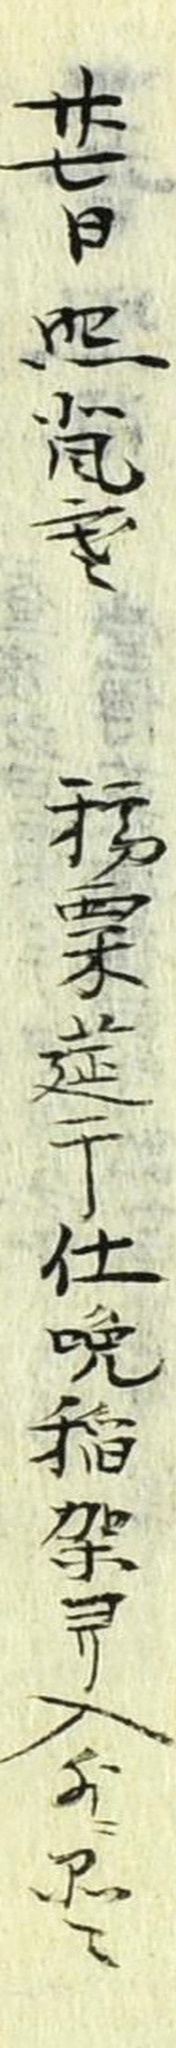廿七日照北風寒糯粟莚干仕番稲架より入外に品々
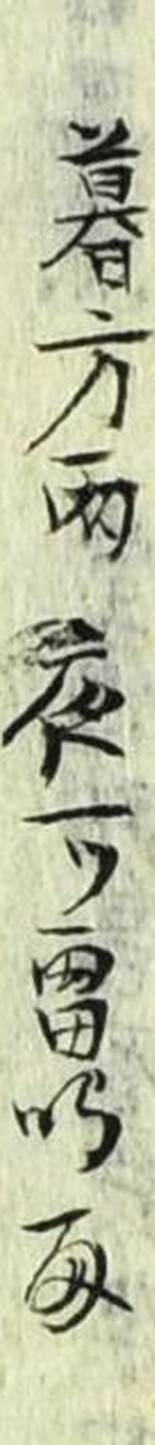暮方雨夜一ツ雷鳴雨
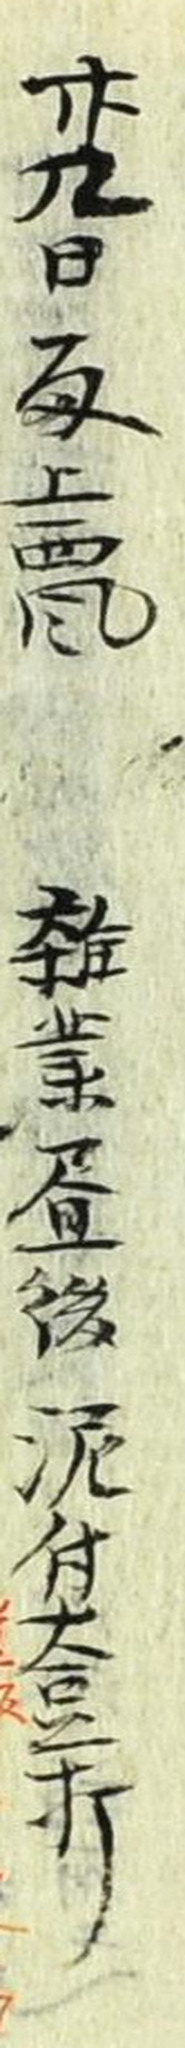廿九日雨上西風雑業昼後泥付大豆打

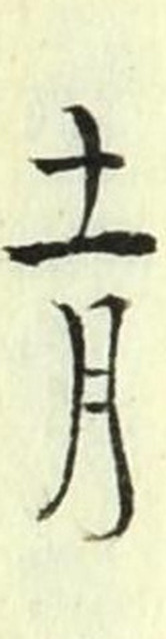十一月
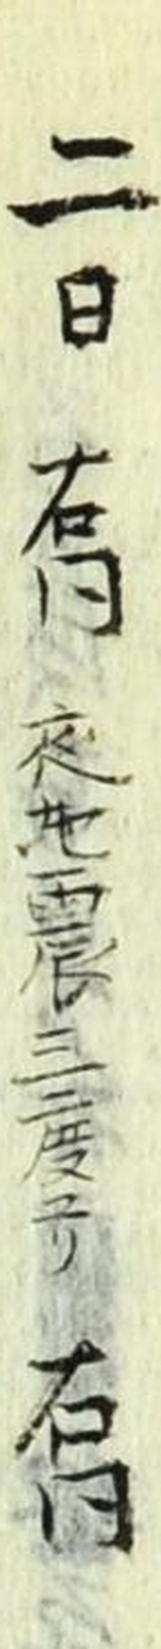二日右同夜地震三度ユリ右同
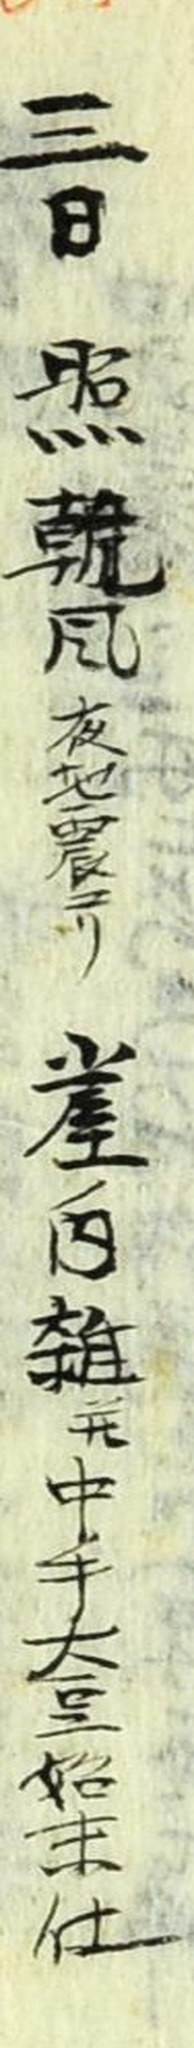三日照朝風夜地震ユリ小屋ノ内雑幷中手大豆始末仕
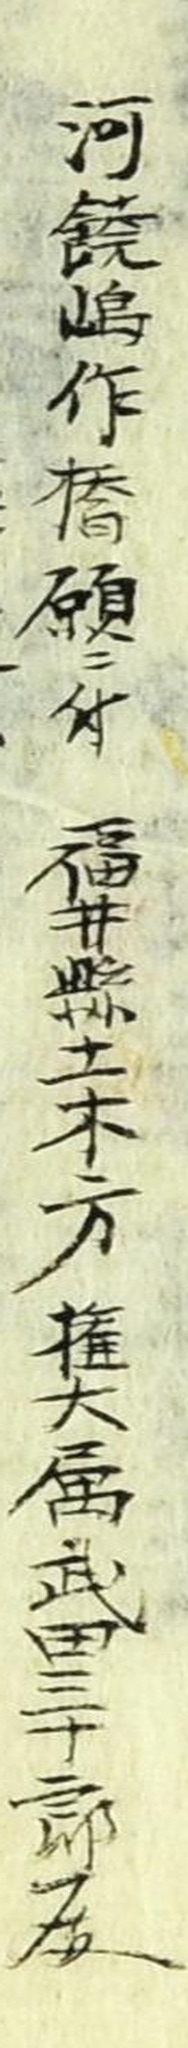河饒島作橋願ニ付福井県土木方権大属武田三十郎殿
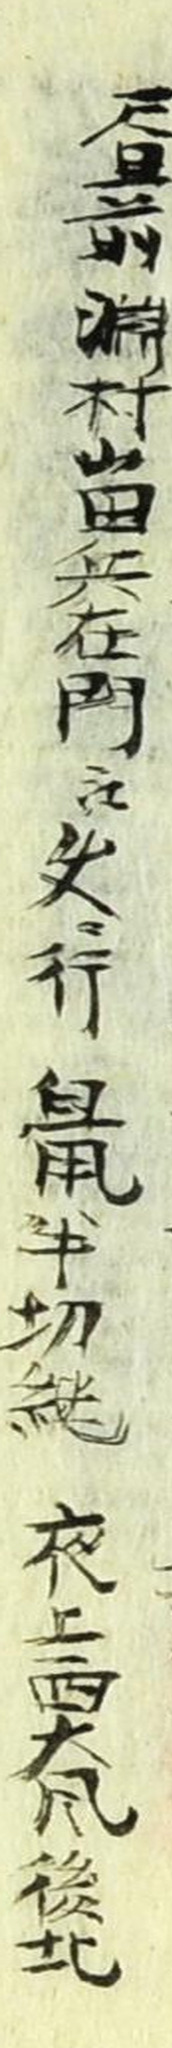昼前淵村山田兵在門江使ニ行鼠半切継夜上西風後北
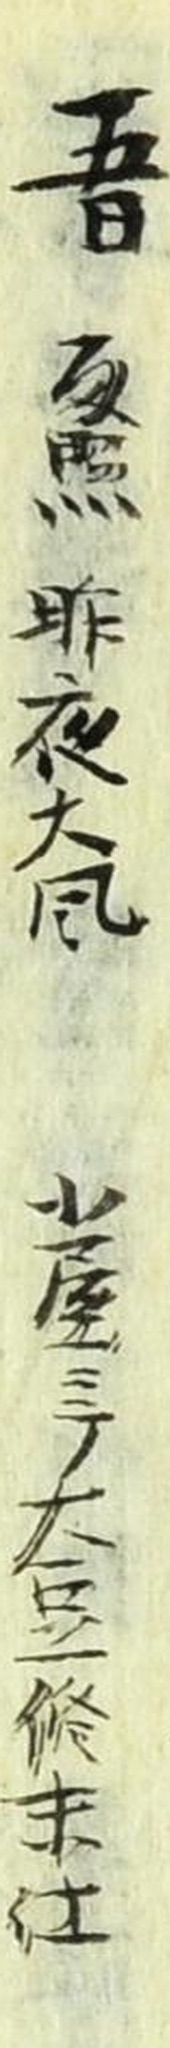五日雨照昨夜大風小屋ニテ大豆修末仕
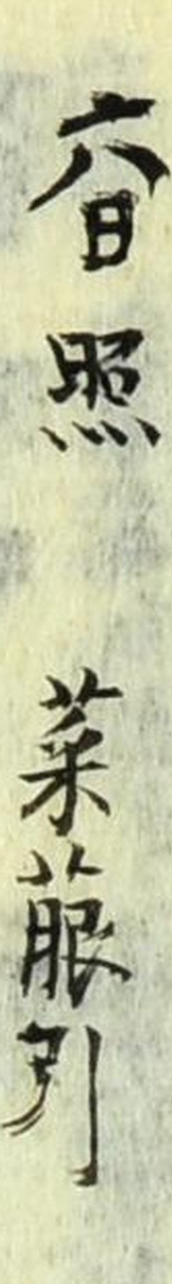六日照菜菔引
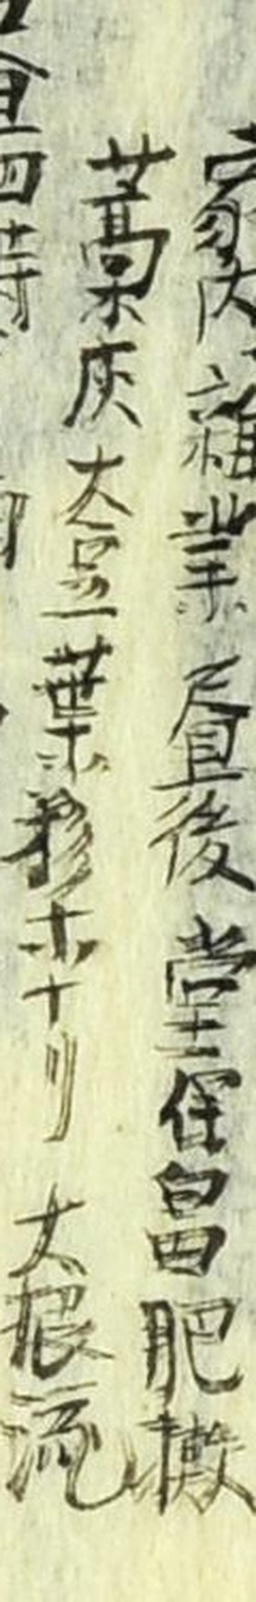藁灰大豆葉杉等ナリ大根流
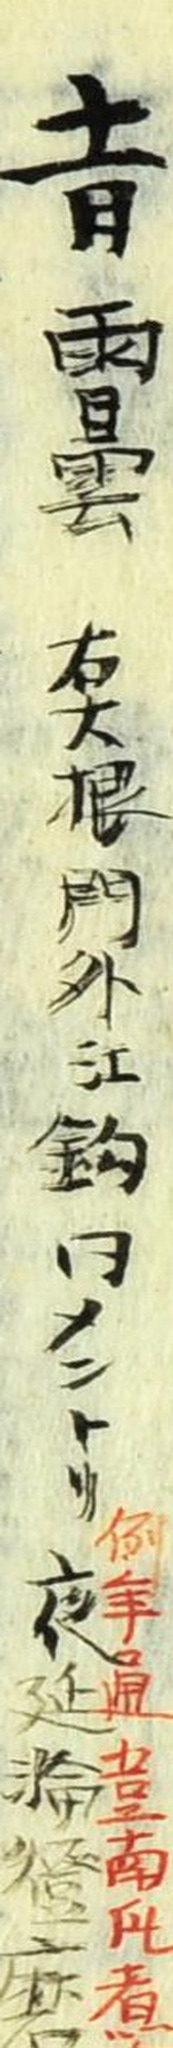十一日雨曇右大根門外江釣同メントリ夜延輪灯磨
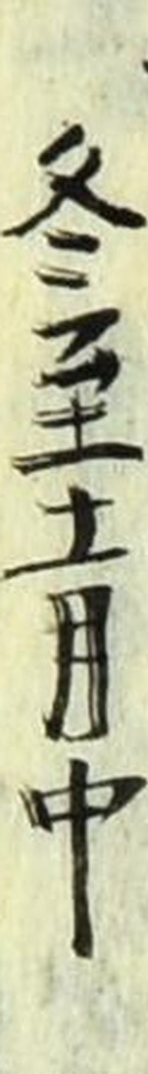冬至十一月中
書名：（日記）
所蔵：福井県文書館 Fukui Prefectural Archives
